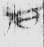左
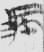馭（御）
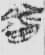番
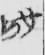戌
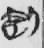○（食）
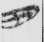田
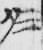於
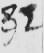○（鄖）
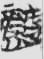○（遣）
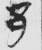邑
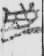城
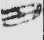田
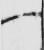一
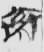索
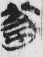畔
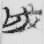戌
